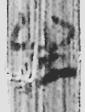生
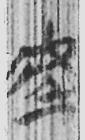𫊟（吾）
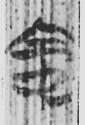{宀𠁩}（仲）
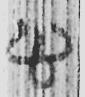心
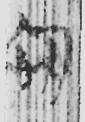念
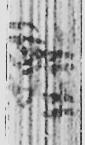詿
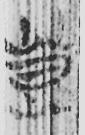莫
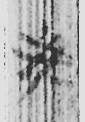我
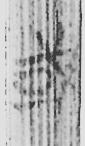或
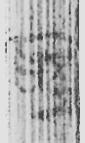聖
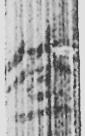𫊟（吾）
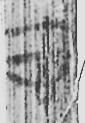{工心}
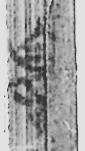辠
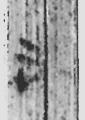之
